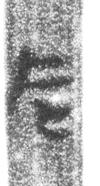同
